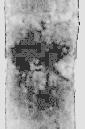四
